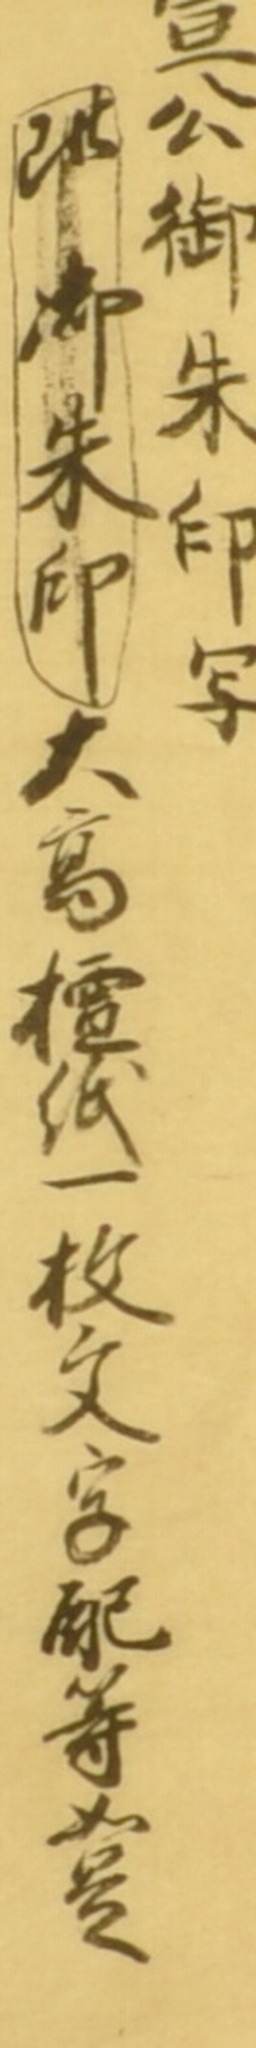此御朱印大高檀紙一枚文字配等如是
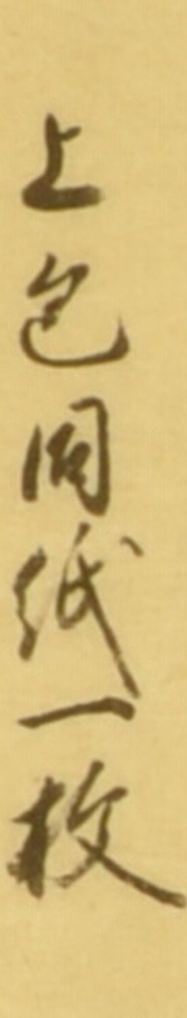上包同紙一枚

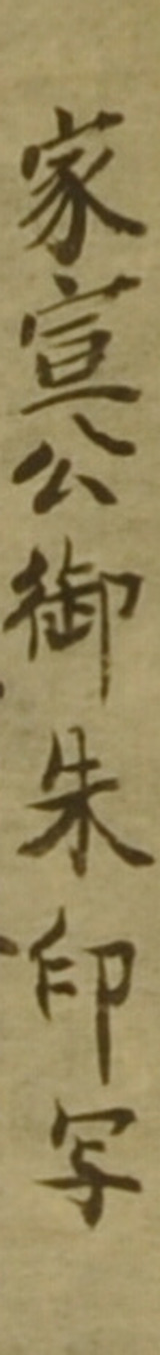家宣公御朱印写
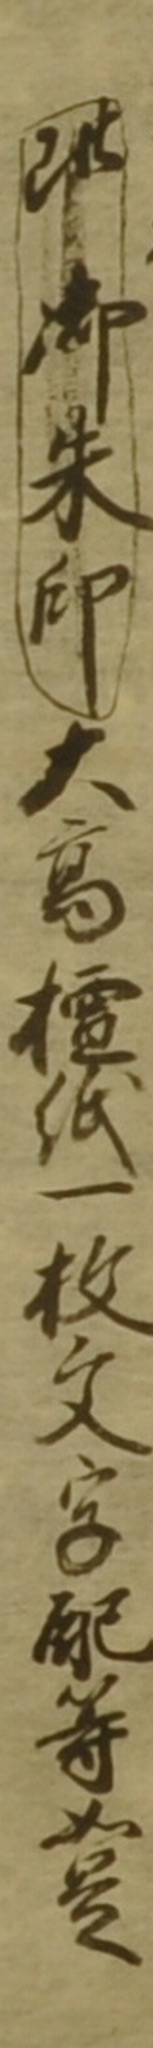此御朱印大高檀紙一枚文字配等如是
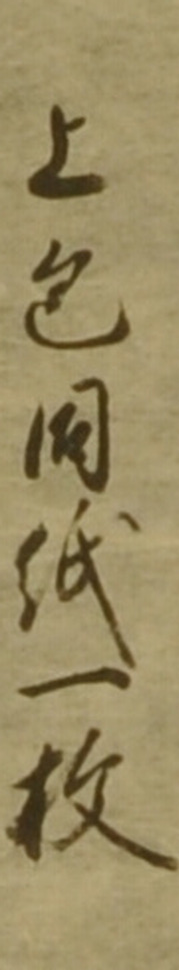上包同紙一枚

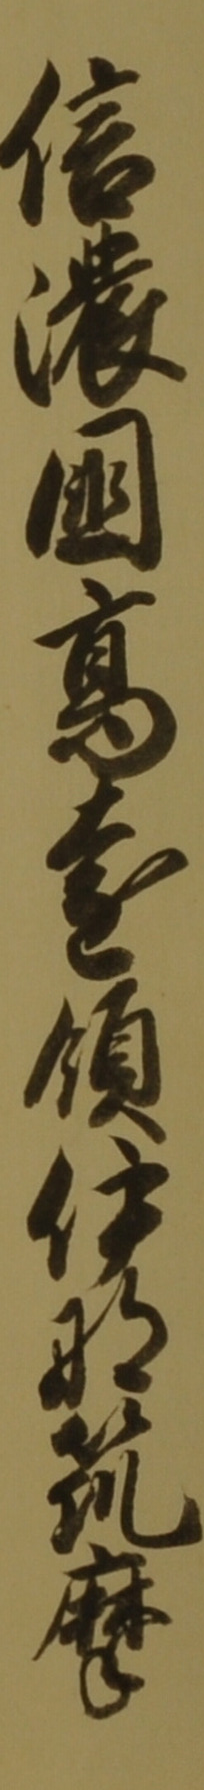信濃国高遠領伊那筑摩
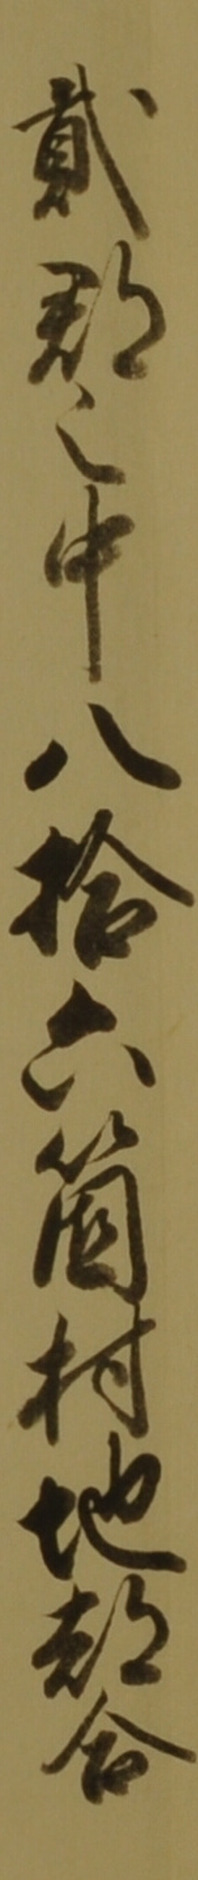貮郡之中八拾六箇村地都合
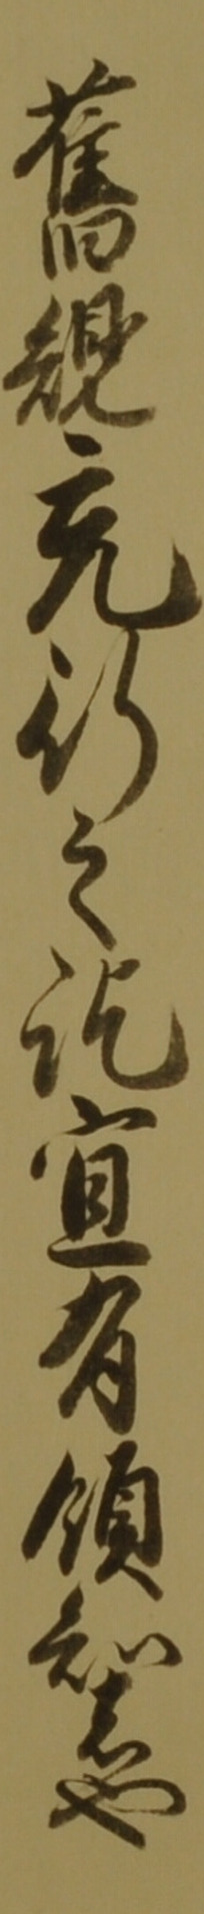旧規充行之訖宜有領知者也
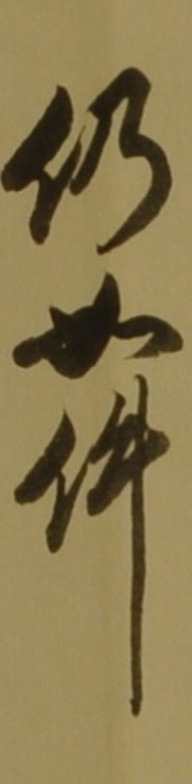仍如件
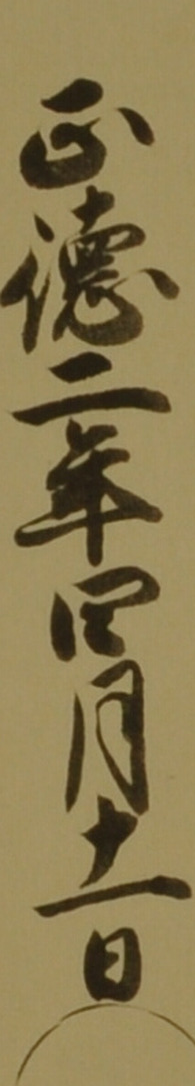正徳二年四月十一日
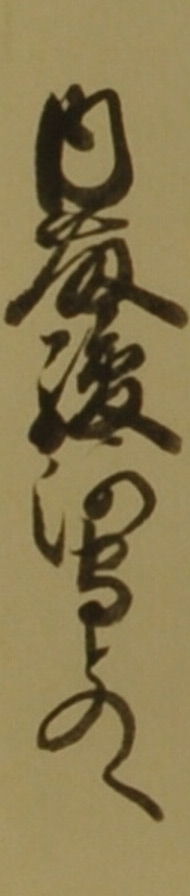内藤駿河守とのへ
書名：御朱印状〔写〕〔同文書二通一括〕
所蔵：伊那市立高遠町図書館・合同会社AMANE
